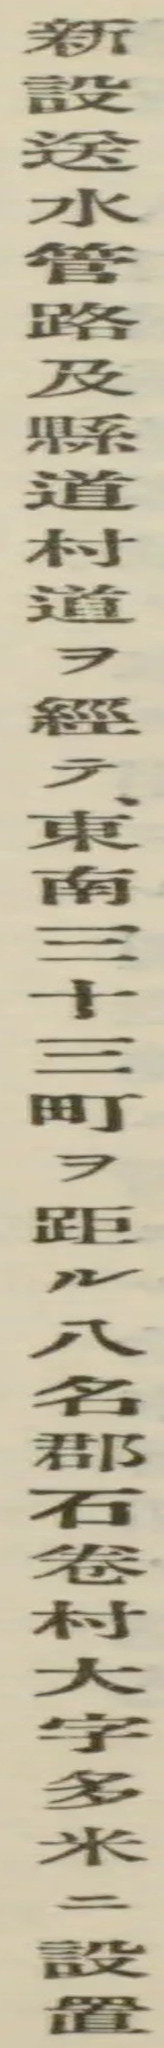新設送水管路県道村道を経て、東南三十三町を距る八名郡石巻村大字多米に設置
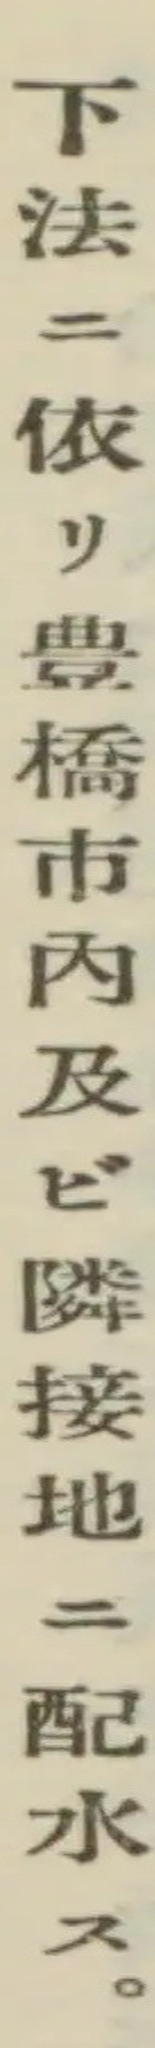下法に依り豊橋市内及び隣接地に配水す。
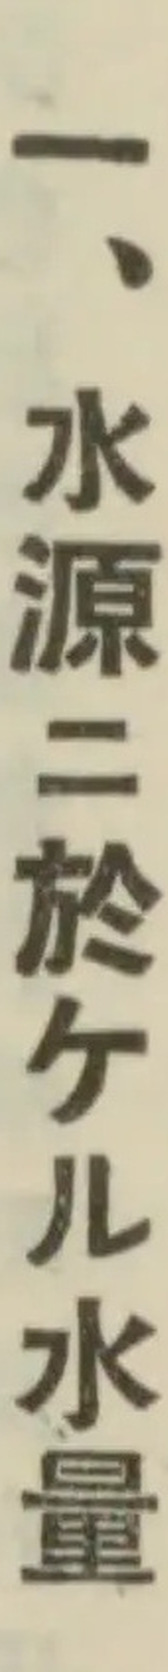一水源に於ける水量
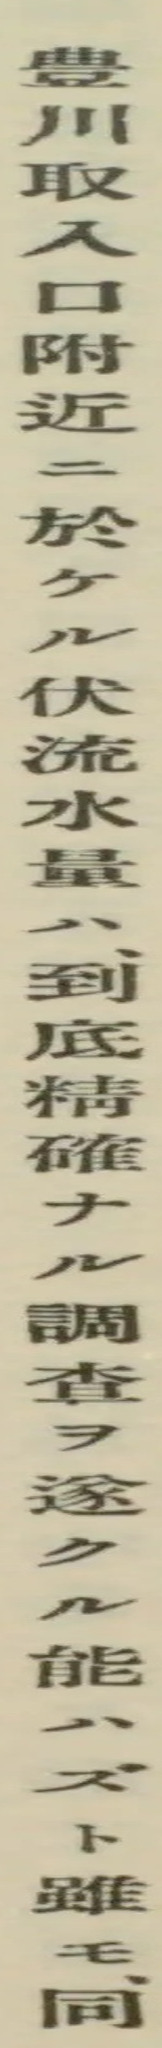豊川取入口付近に於ける伏流水量は、到底精確なる調査を遂くる能はずと雖も、同
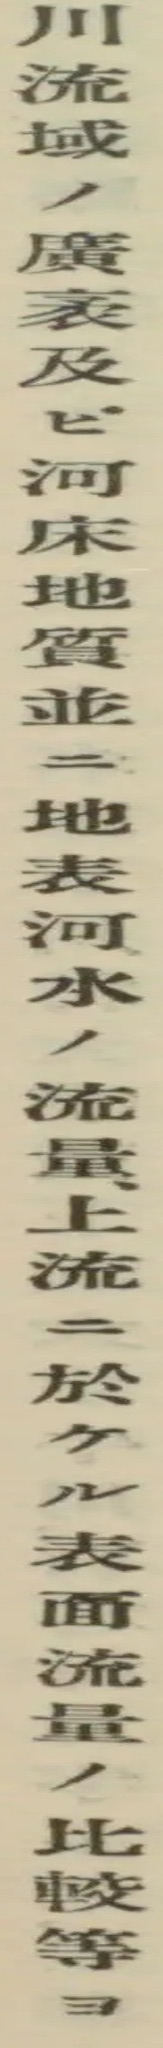川流域の廣袤及び河床地質並に地表河水の流量、上流に於ける表面流量の比較等よ
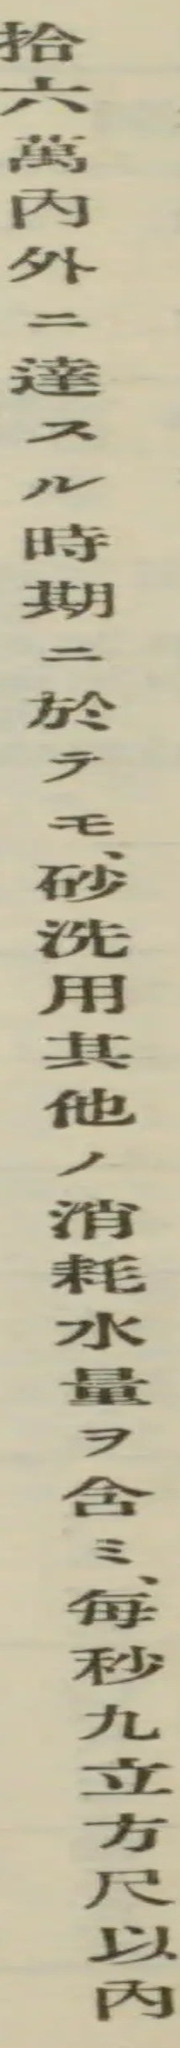拾六萬内外に達する時期に於ても、砂洗用其他の消耗水量を含み、毎秒九立方尺以内
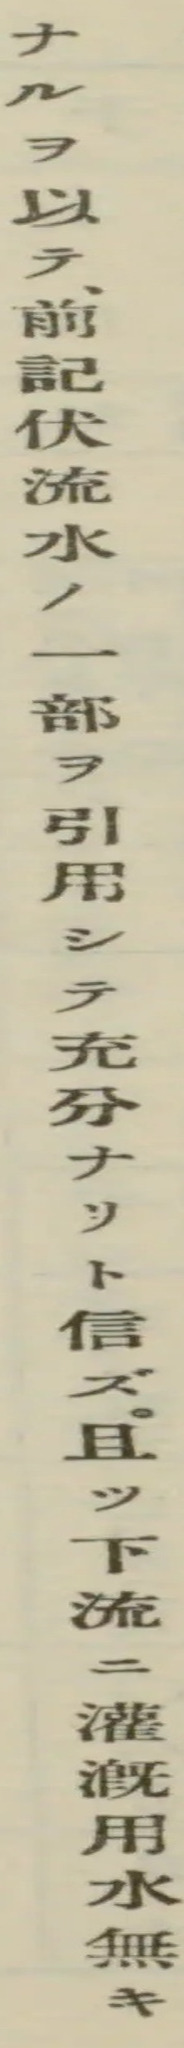なるを以て、前記伏流水の一部を引用して充分なりと信ず。且つ下流に灌漑用水無き
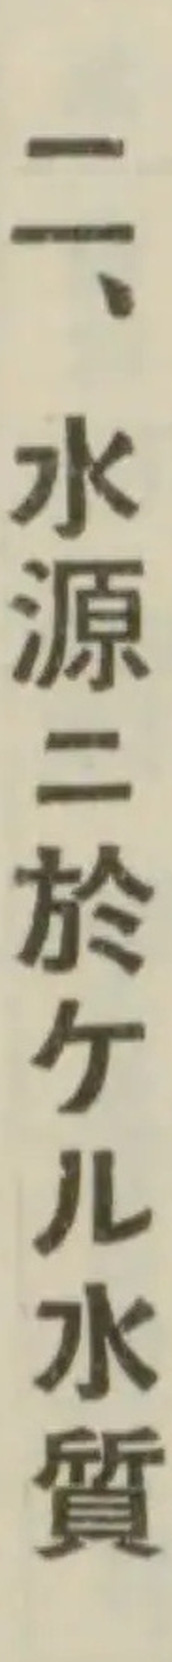二、水源に於ける水質
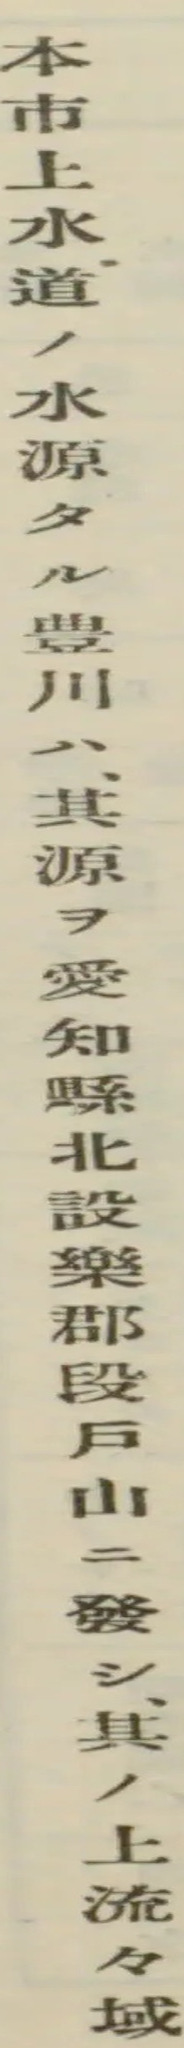本市水道の水源たる豊川は、其源を愛知県北設樂郡段戸山に発し、其の上流々域
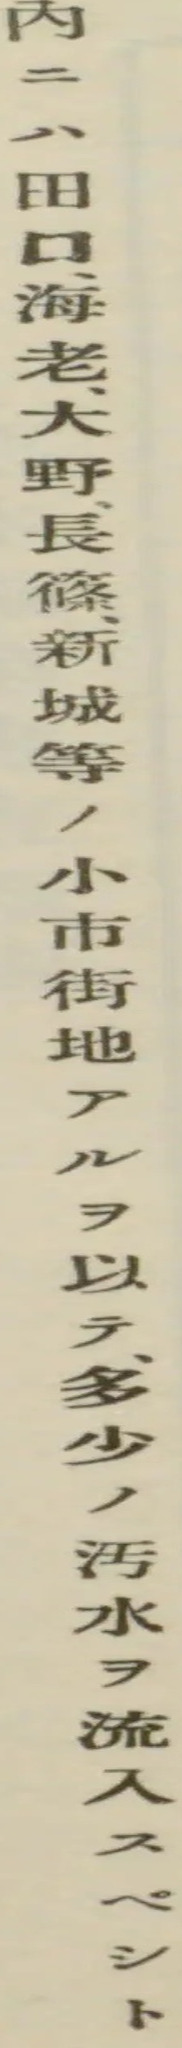内には田口、海老、大野、長篠、新城等の小市街地あるを以て、多少の汚水を流入すべしと
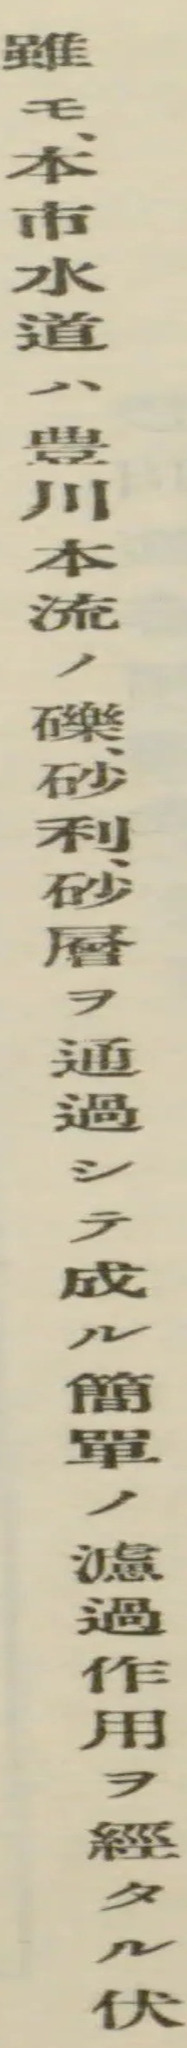雖も、本市水道は豊川本流の礫、砂利、砂屑を通過して成る簡単の濾過作用を経たる伏
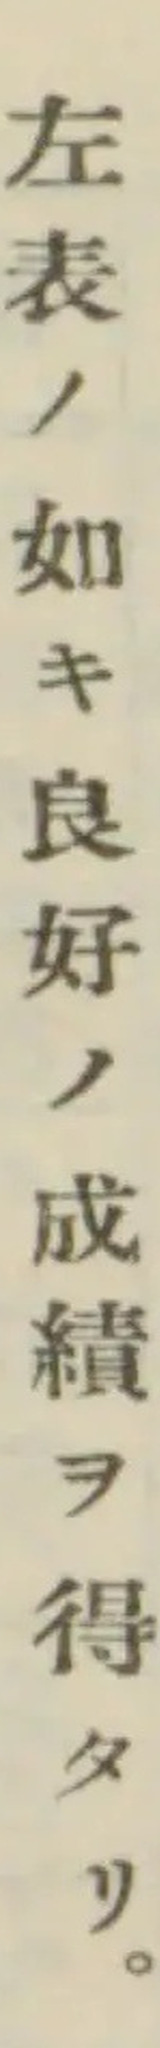左表の如き良好の成績を得たり。
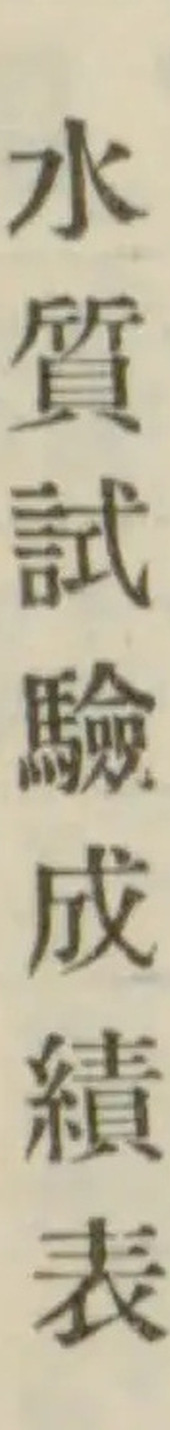水質試験成績表
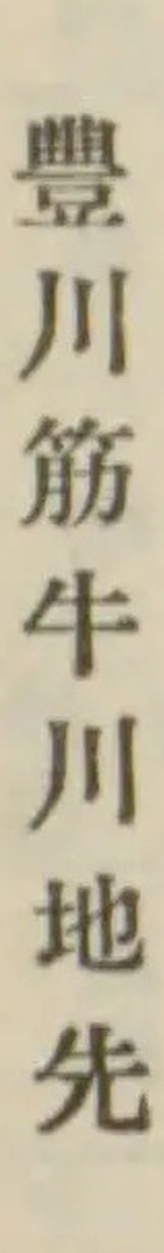豊川筋牛川地先

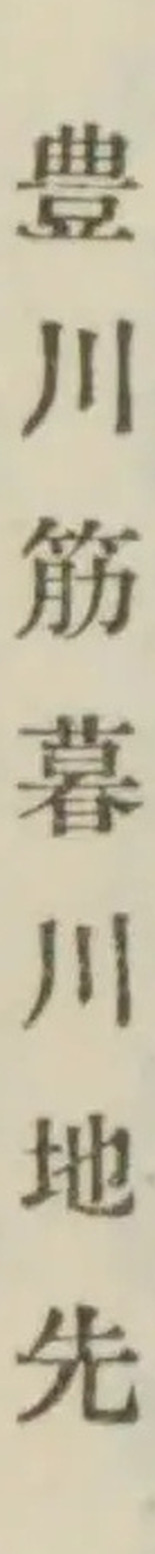豊川筋暮川地先
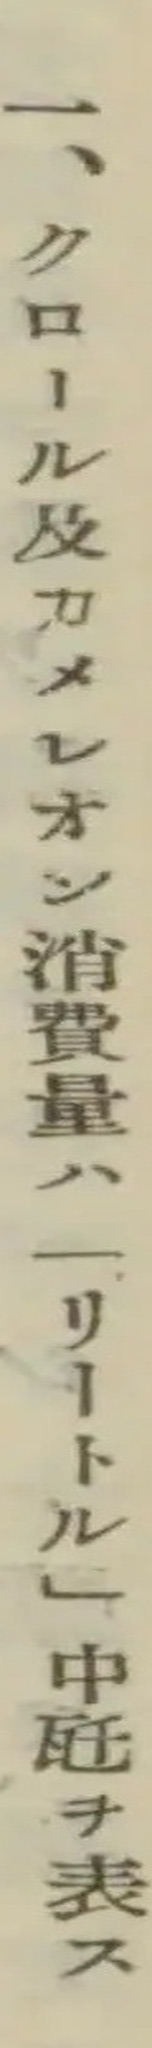備考一、クロール及カメレオン消費量は「リートル」中瓩を表す
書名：豊橋市水道誌
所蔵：国立国会図書館 National Diet Library, JAPAN
